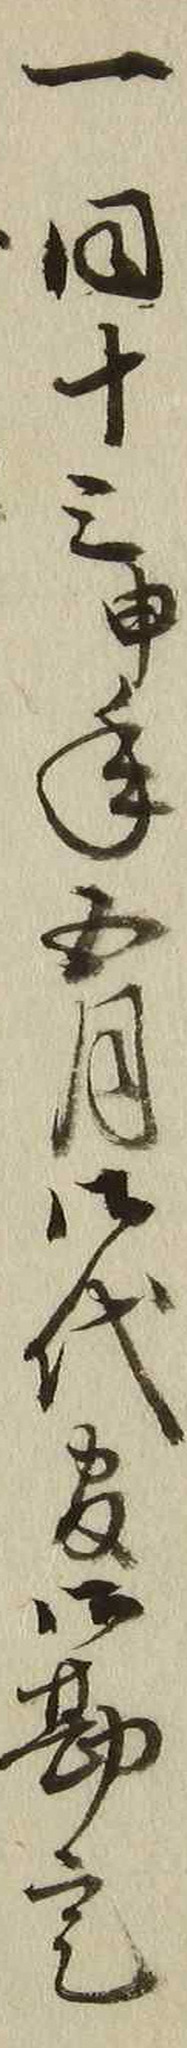一同十三申年五月御代官御勤定
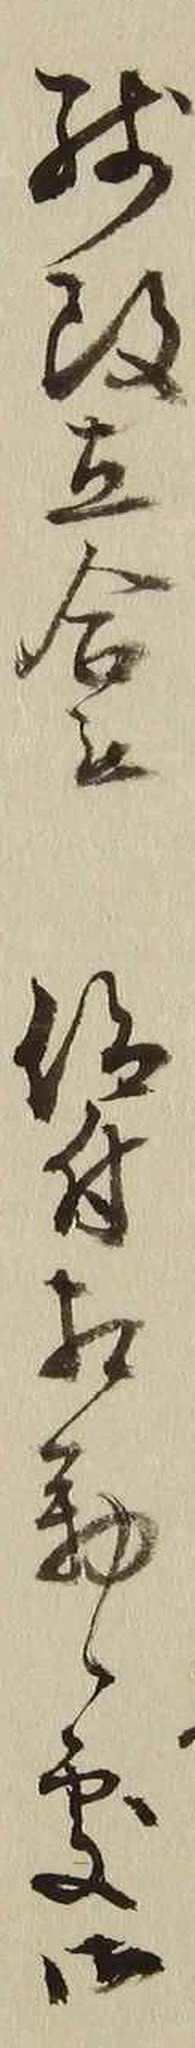残改立合被仰付相勤候処御
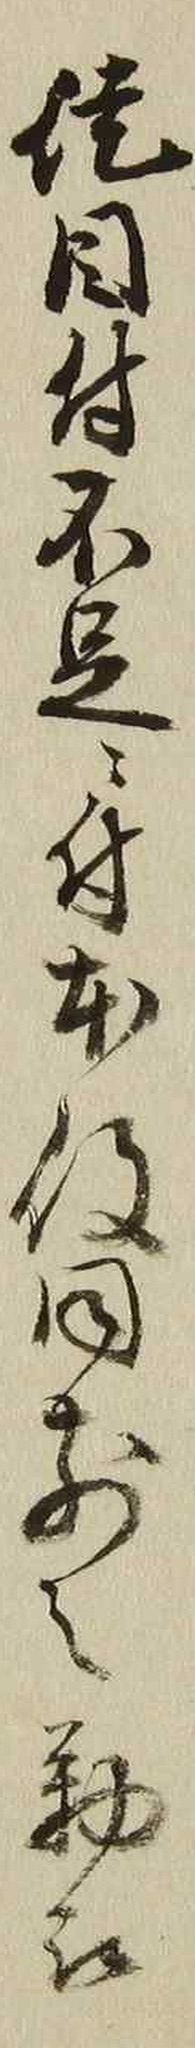徒目付不足に付本役同前之勤被
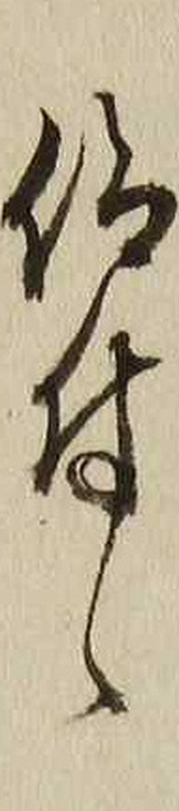仰付候
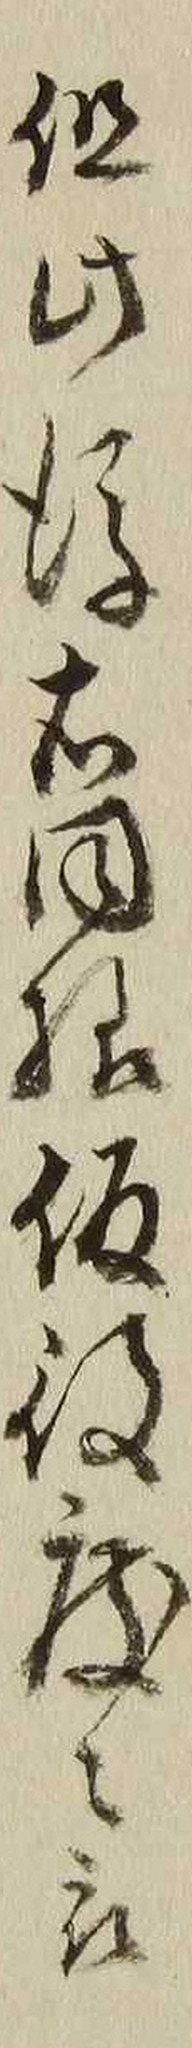但此後右同様仮役度々被
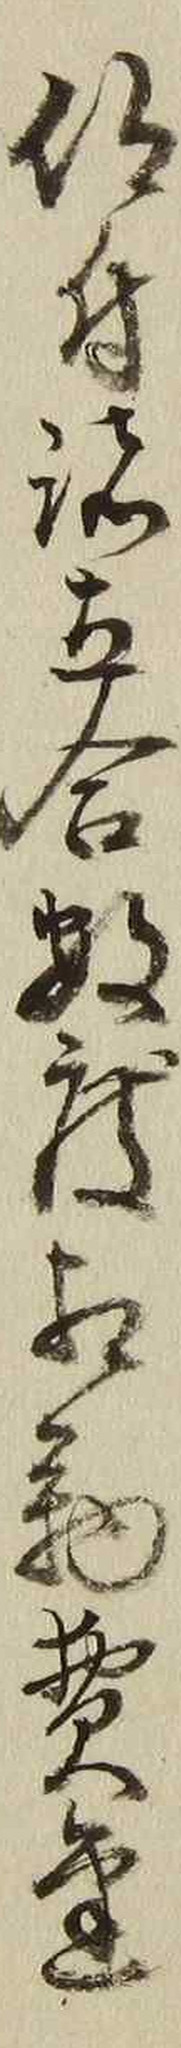仰付諸立合数度相勤費金
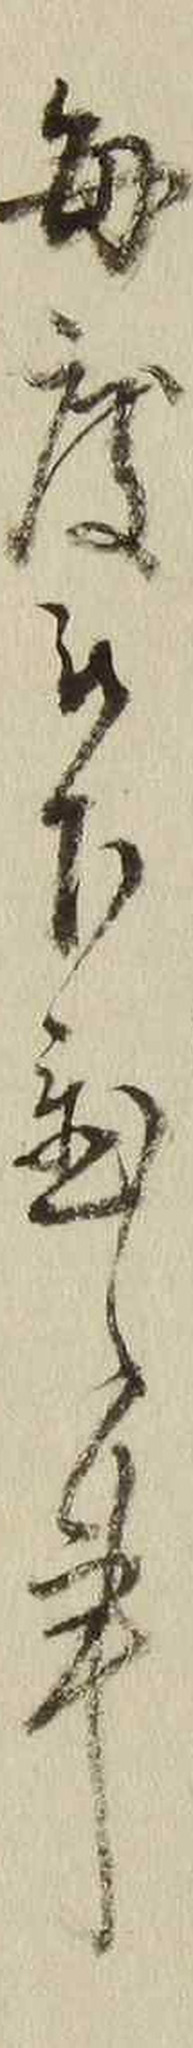毎度被下置候事
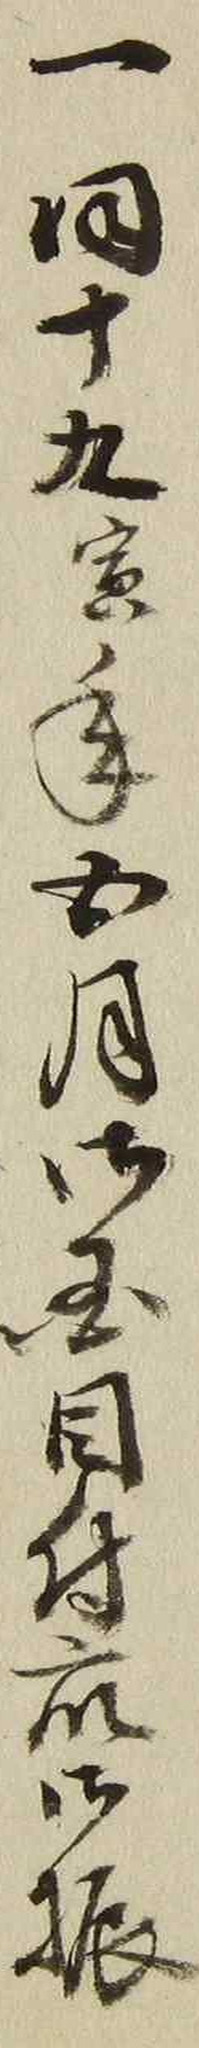一同十九寅年五月御国目付集衆御振
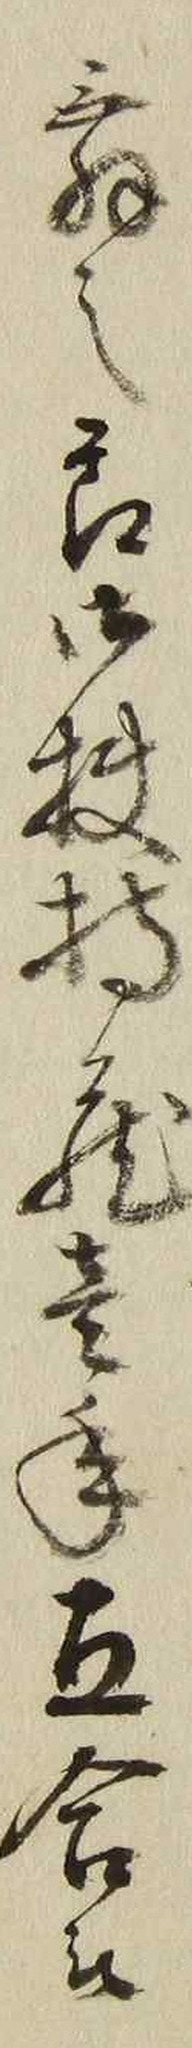舞之節御扶持蔵壱年立合被
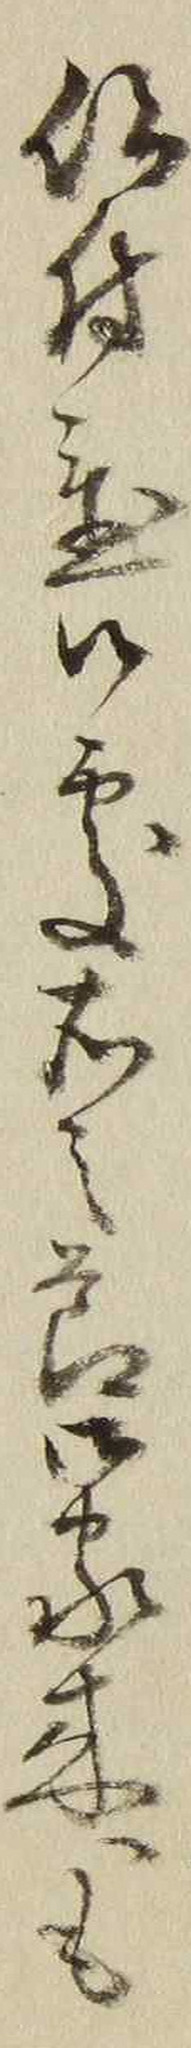仰付置候処右之節御家来へも
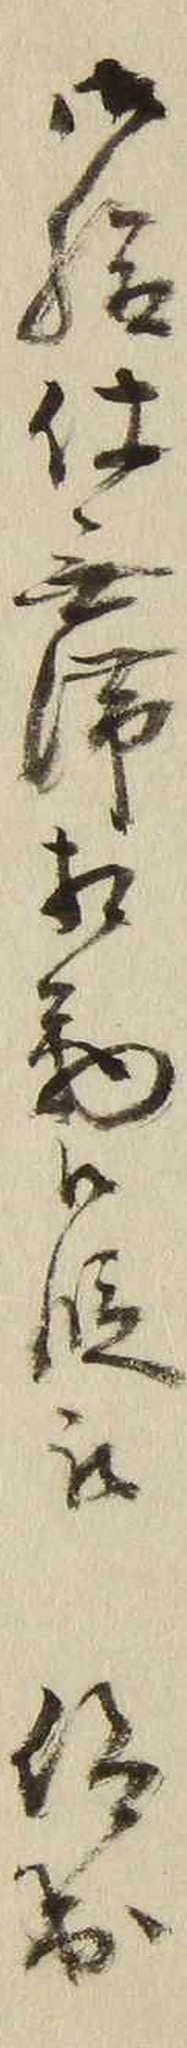御給仕無滞相勤候段被仰出

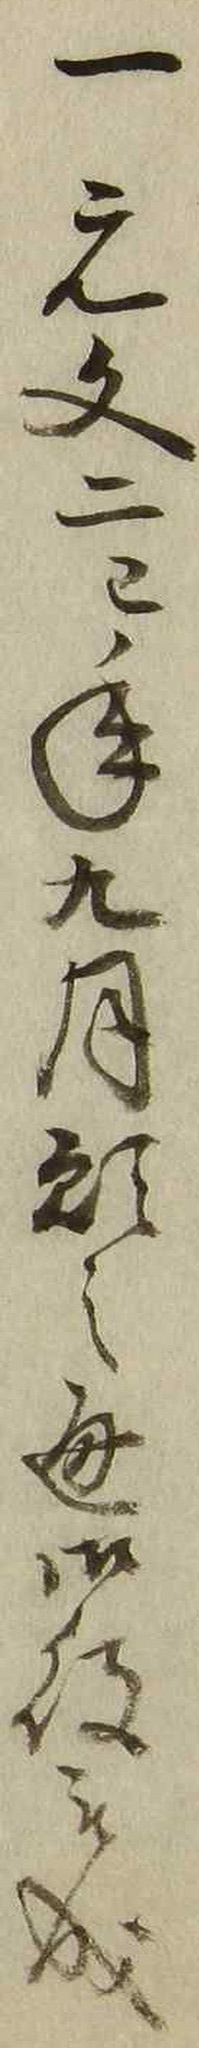一元文二巳年九月願之通御役被成
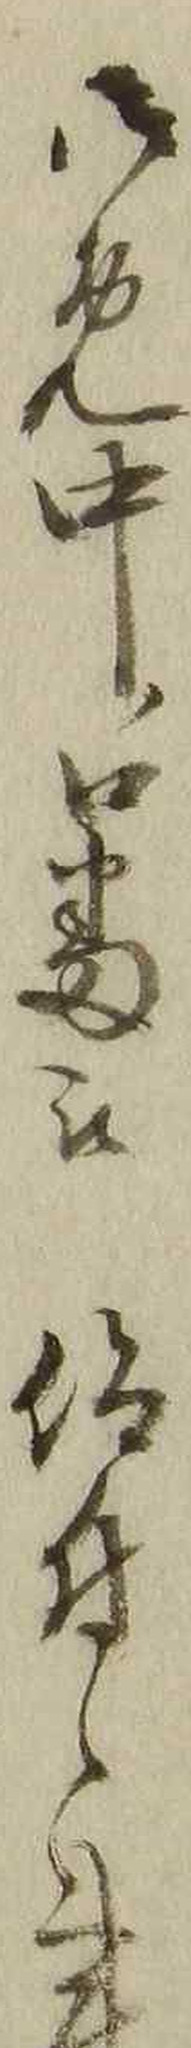御免中ノ口番被仰付候事
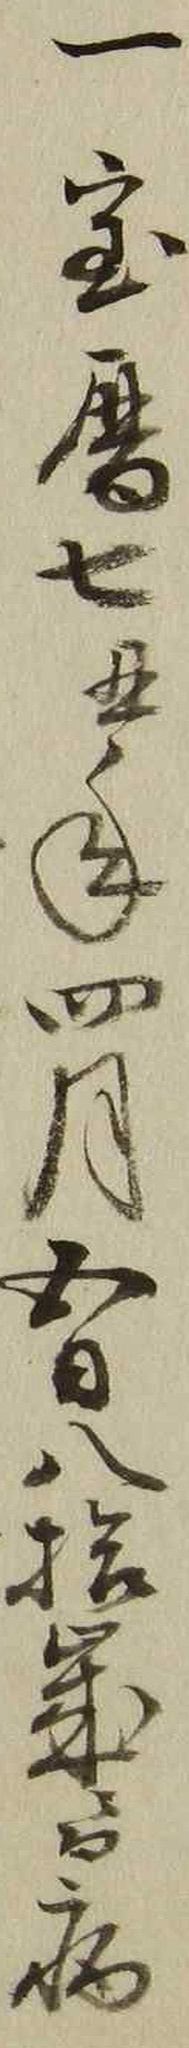一宝暦七丑年四月五日八拾歳に而病
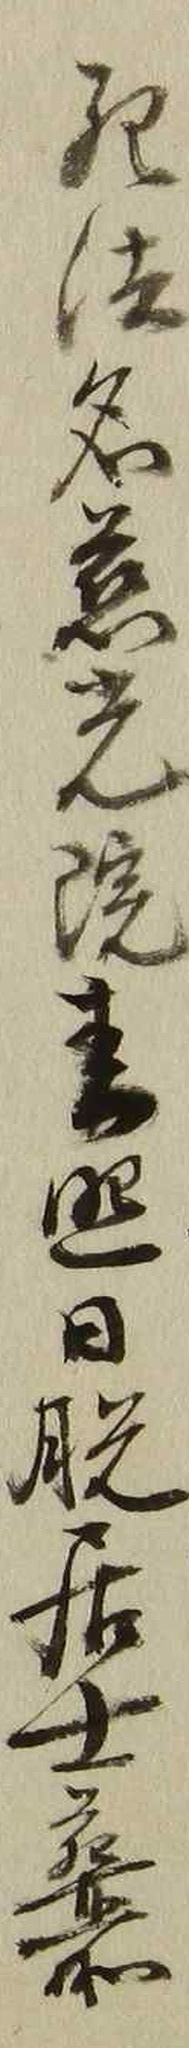死法名慈光院青照日脱居士葬所
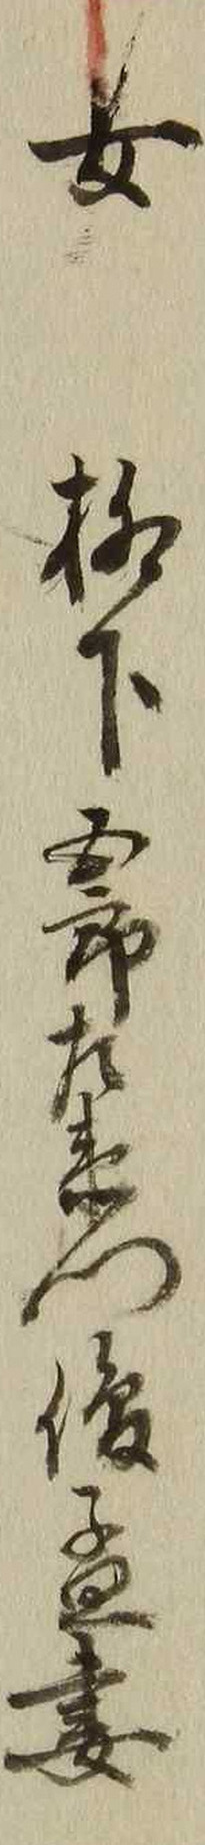女格下五郎左衛門俊孟妻
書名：諸士系譜　巻之38　は之部6
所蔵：会津若松市立会津図書館
